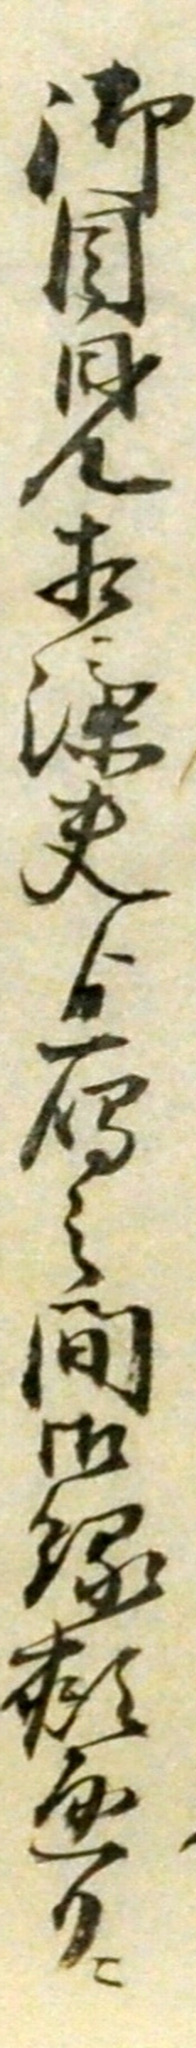御目見相済夫ゟ雁之間御縁頬通りに
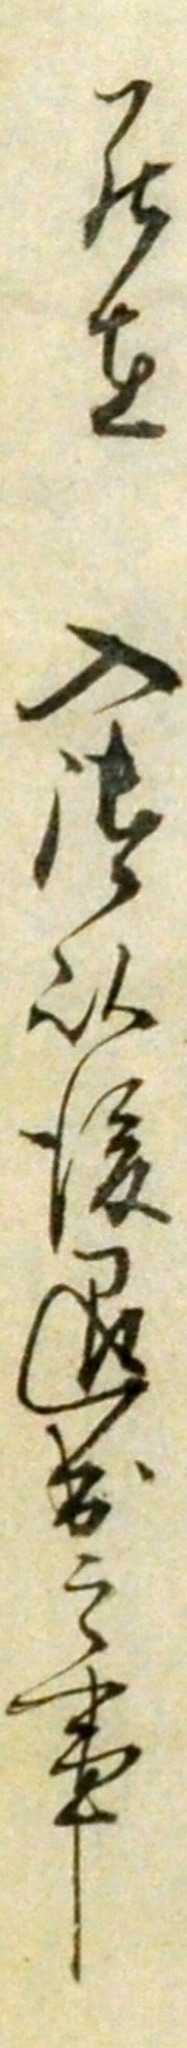罷在入御以後退出之事
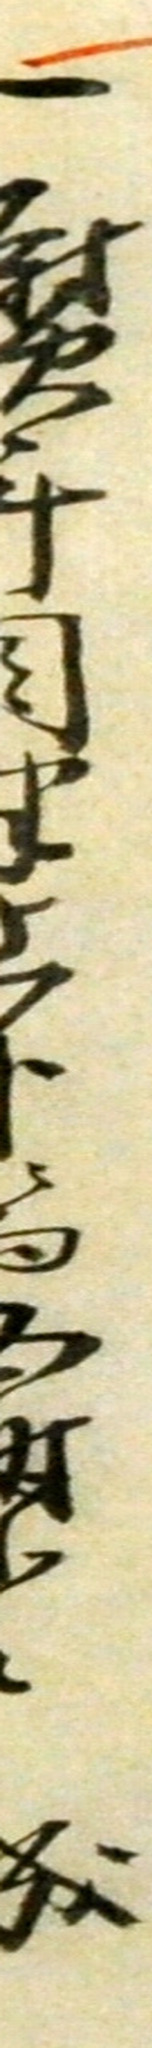一熨斗目半上下にて五時前登城

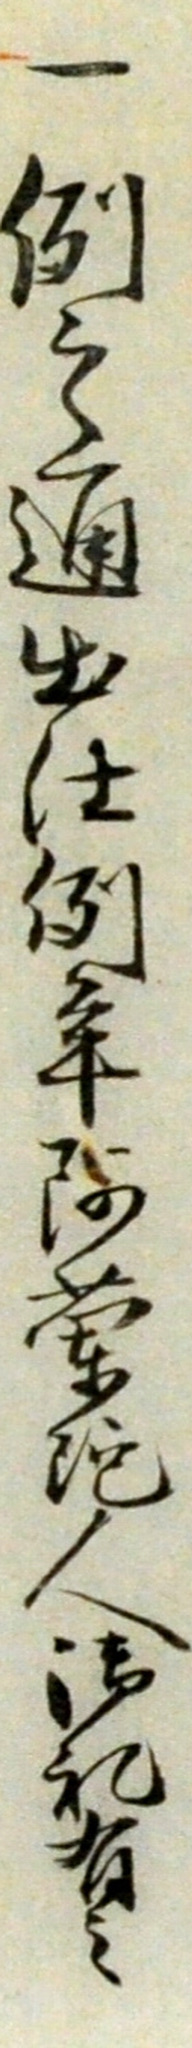一例之通出仕例年阿蘭陀人御礼有之
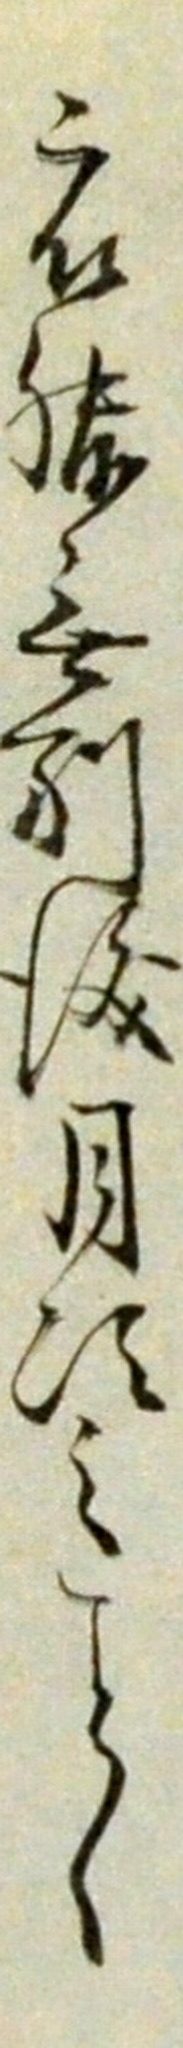衣服無別儀月次之ことく
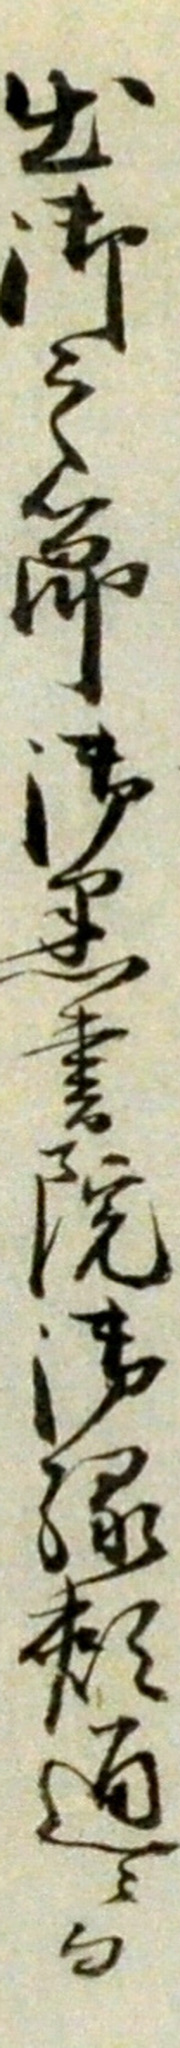出御之節御黒書院御縁頬通にて
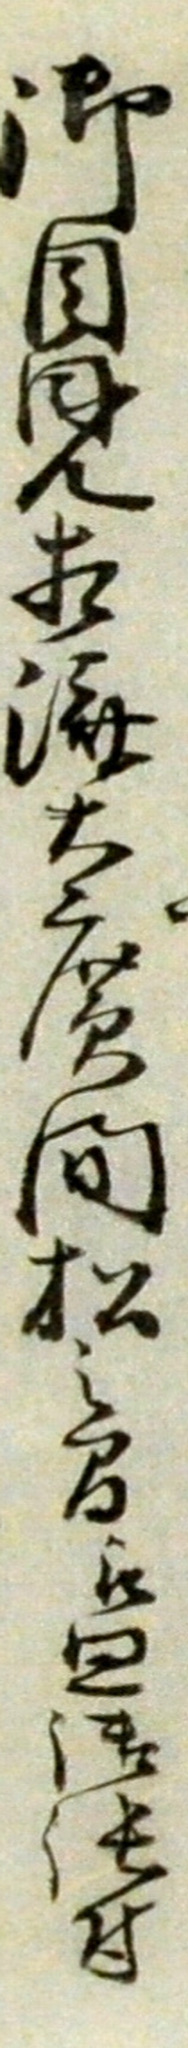御目見相済大広間松之間え廻御張付
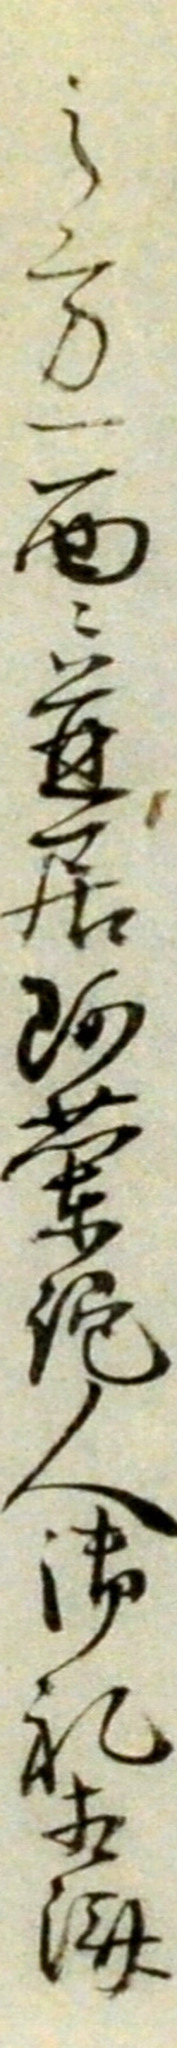之方一面に並居阿蘭陀人御礼相済
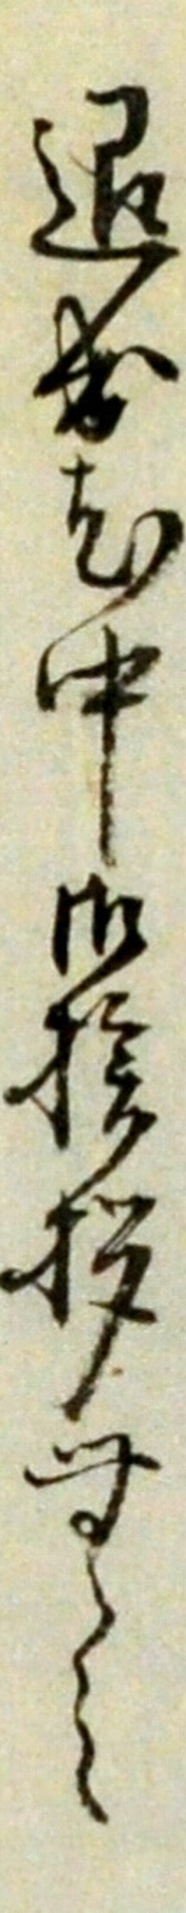退出老中御挨拶無之
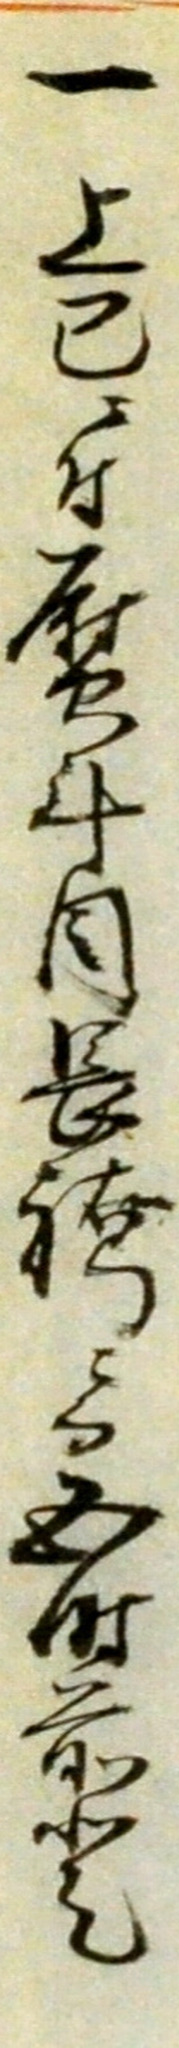一上巳に付熨斗目長袴にて五時前登
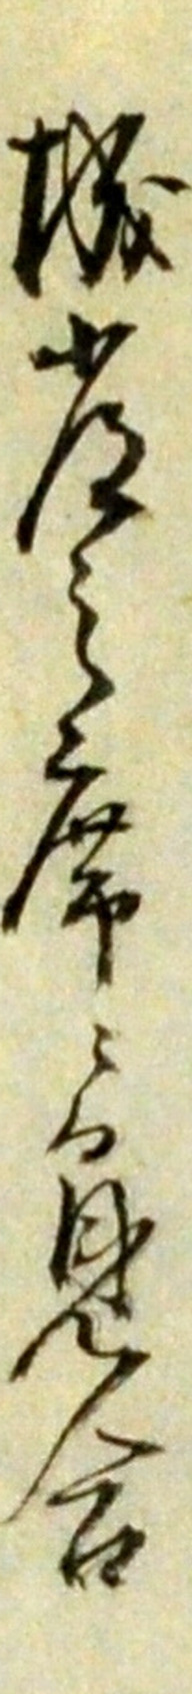城常之席にて見合
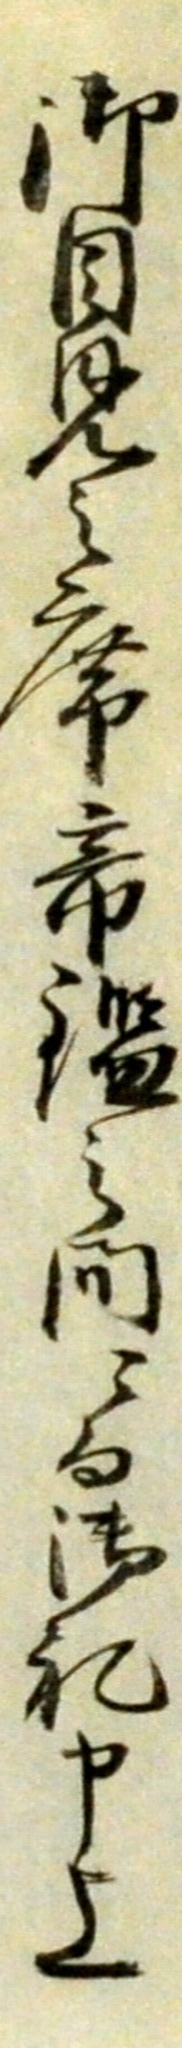御目見之席帝鑑之間にて御礼申上
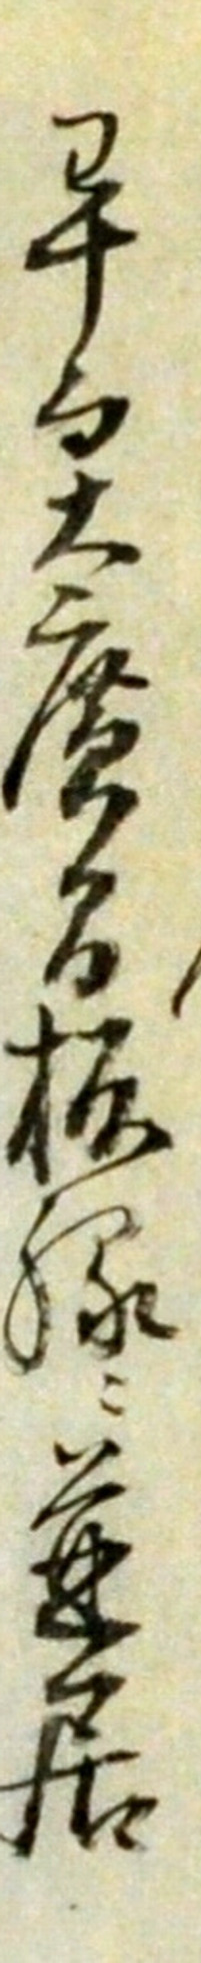畢て大広間板縁に並居
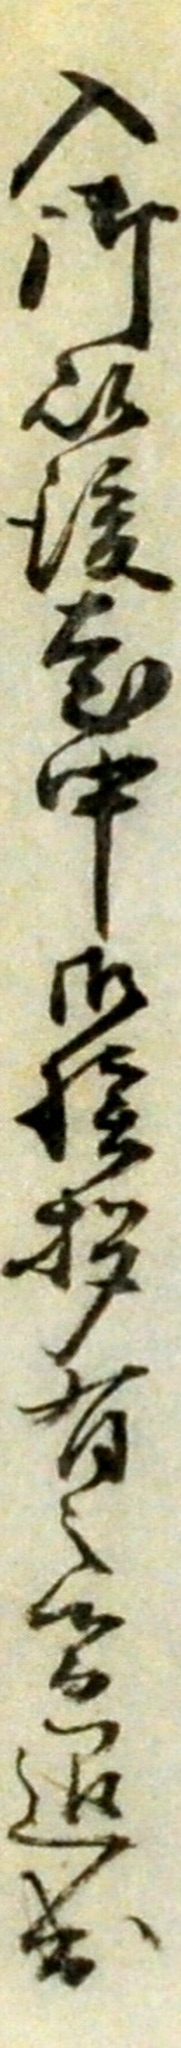入御以後老中御挨拶有之候て退出
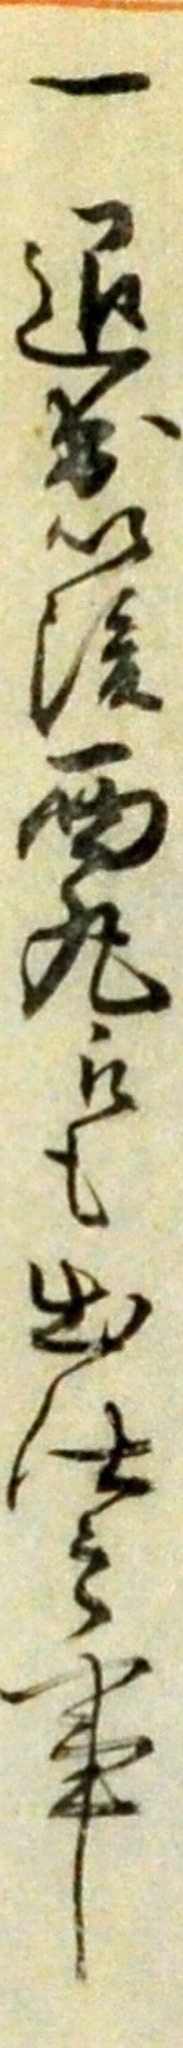一退出以後西丸えも出仕之事
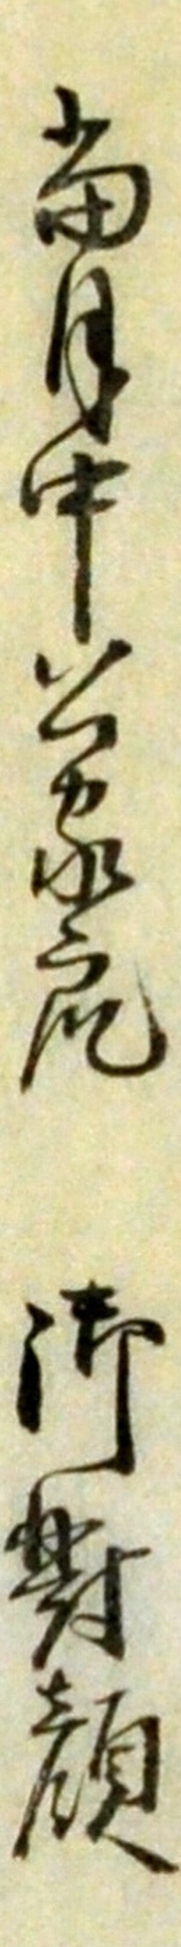当月中公家衆御対顔
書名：申合帳〔一括〕
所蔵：伊那市立高遠町図書館・合同会社AMANE
